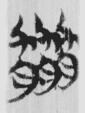脅
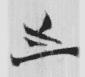之
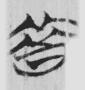昔
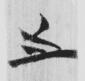之
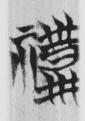{示巤}
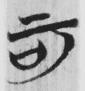可
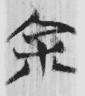余
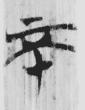不
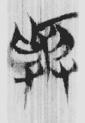與
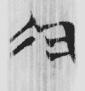今
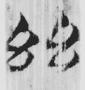𢆶
